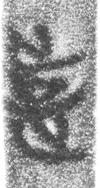○（游）
